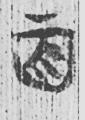百
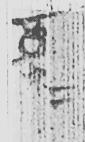五十=
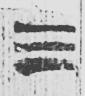三
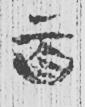百
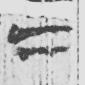二
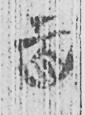百
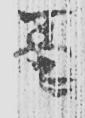五十=
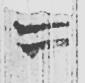二
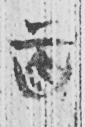百
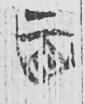百
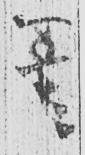五十=
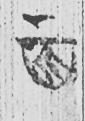百
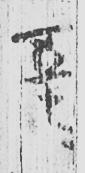五十=
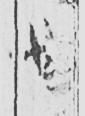廿=
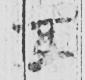五
